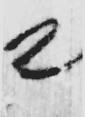己
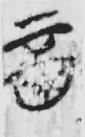梄（酉）
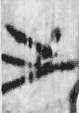之
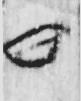日
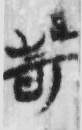苛
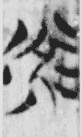光
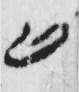㠯（以）
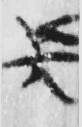長
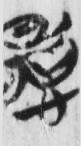惻
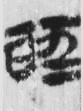爲
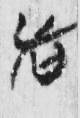左
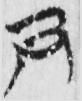尹
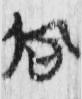卲
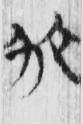{力它}
